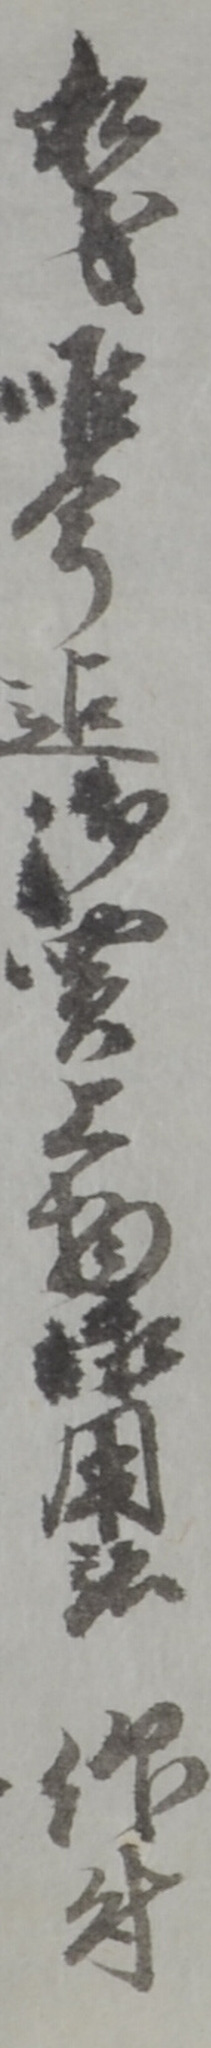私義唯今迄御買上物御用被仰付
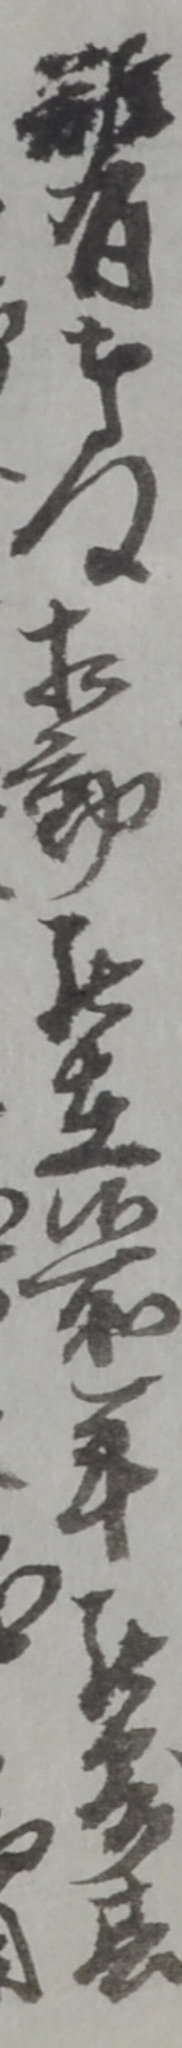難有奉存相勤罷在候所年罷寄其
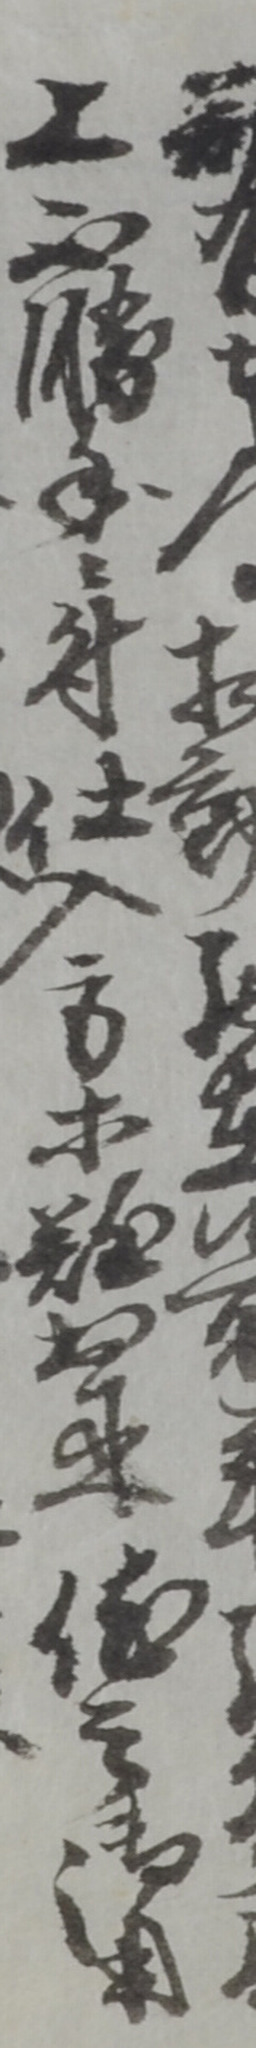上不勝手ニ付仕入方等難出来依之御用
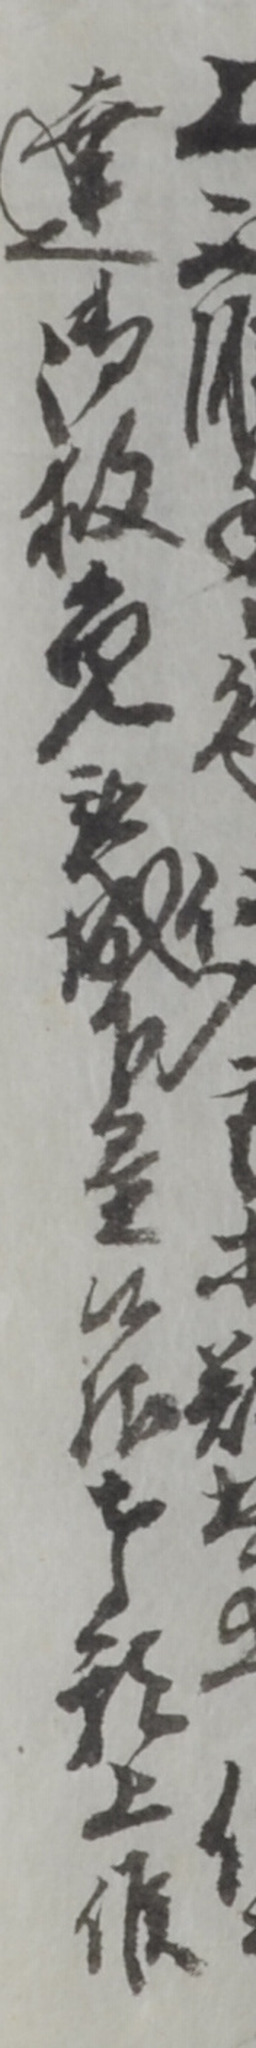達御赦免被成下置候様奉願上候

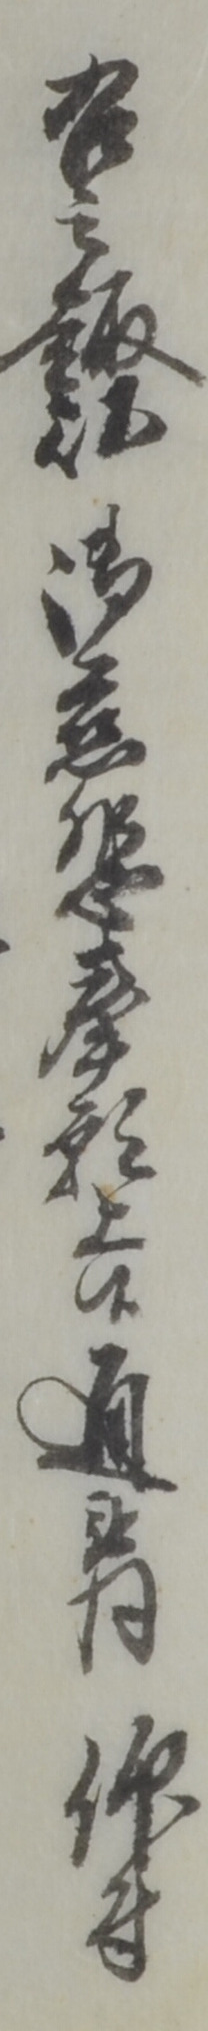右之趣以御慈悲奉願上候通被為仰付
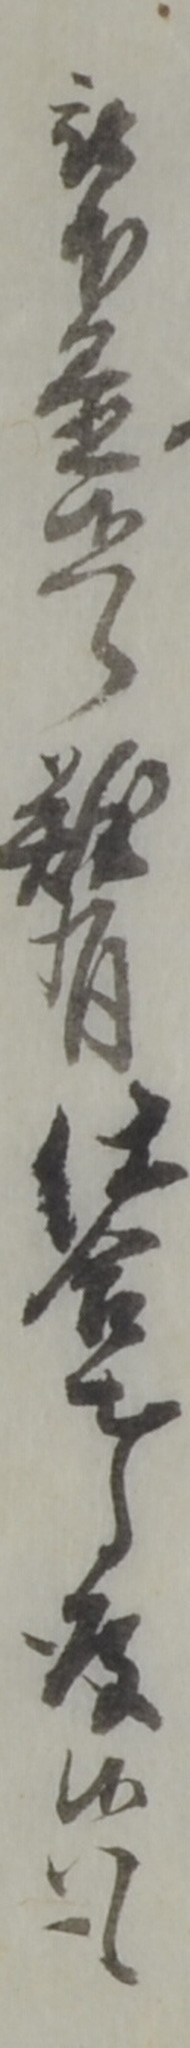被下置候ハヽ難有仕合奉存候以上
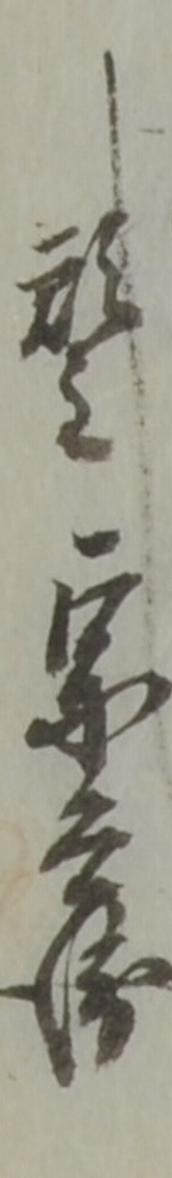願主宗兵衛
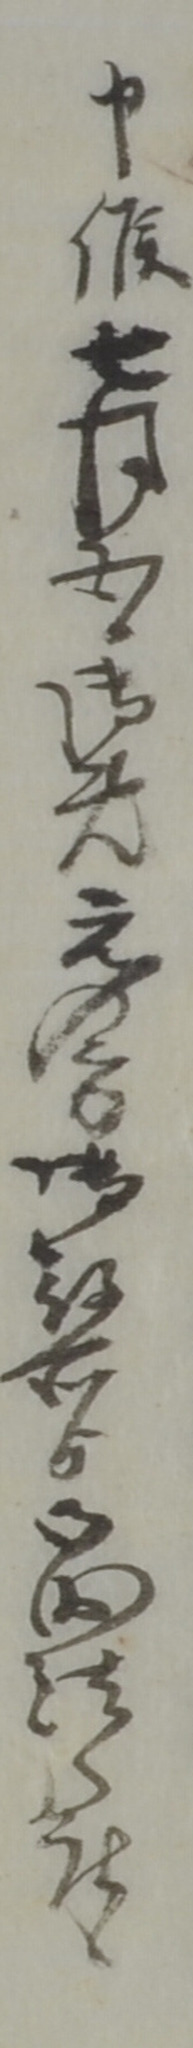申候七月五日御第元〆方御役所ゟ御沙汰御座候
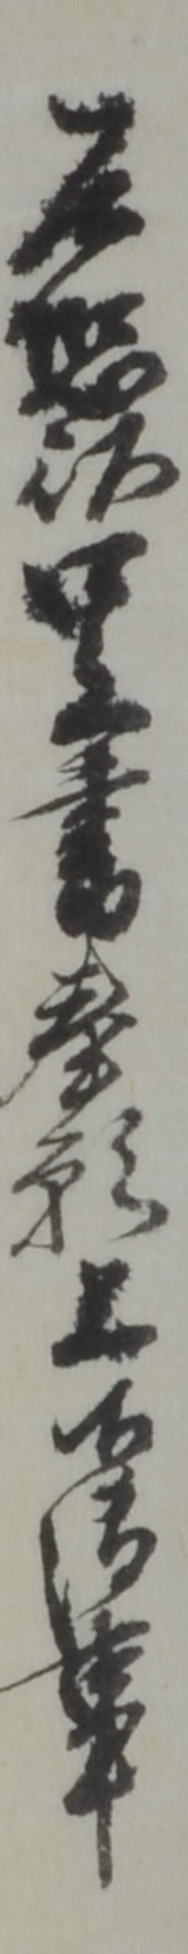乍恐以口上書奉願上候御事
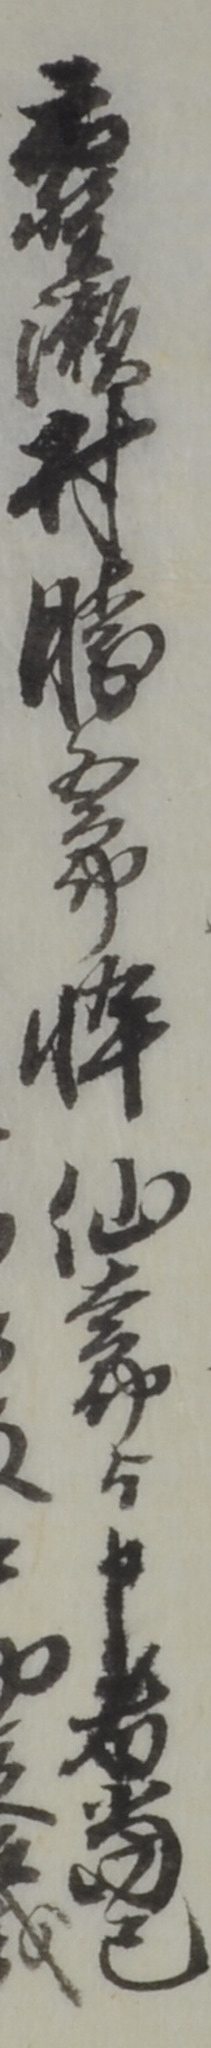市野瀬村勝五郎忰仙太郎与申者当巳
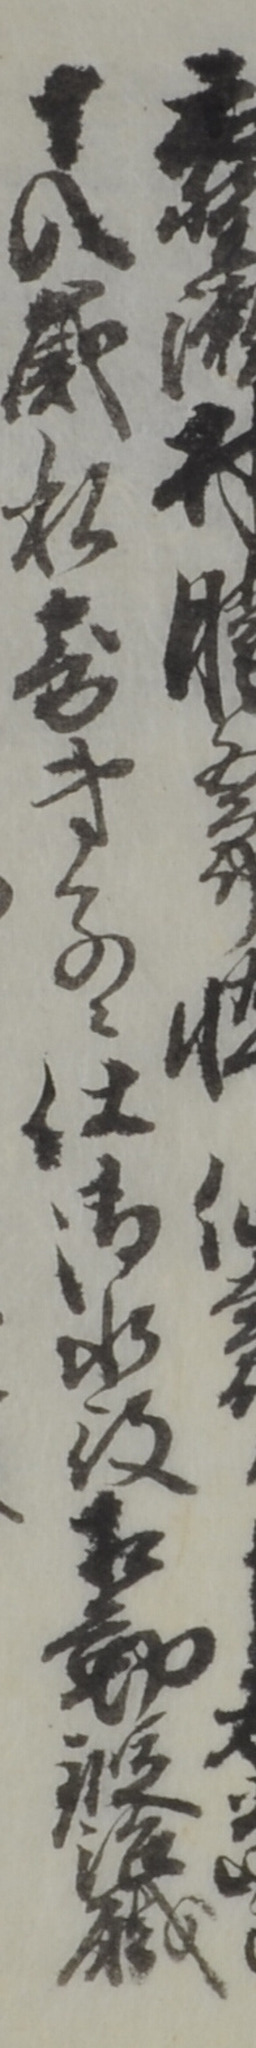十八歳私寄弟子ニ仕御水役相勤鍛冶職
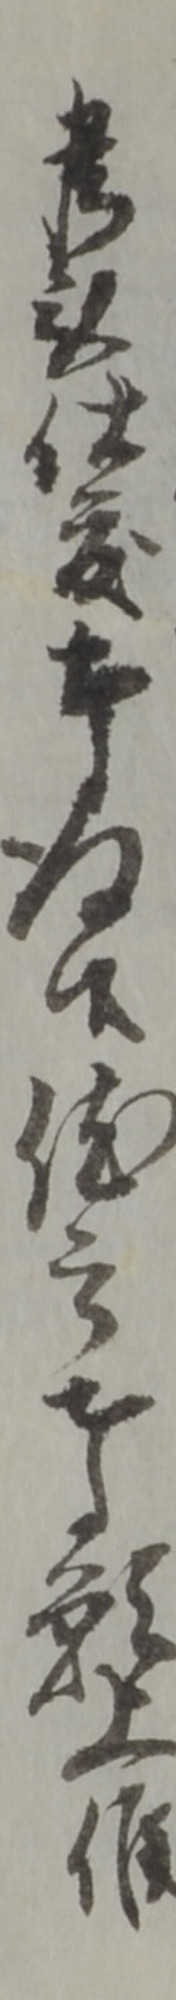為被仕度奉存候依之奉願上候
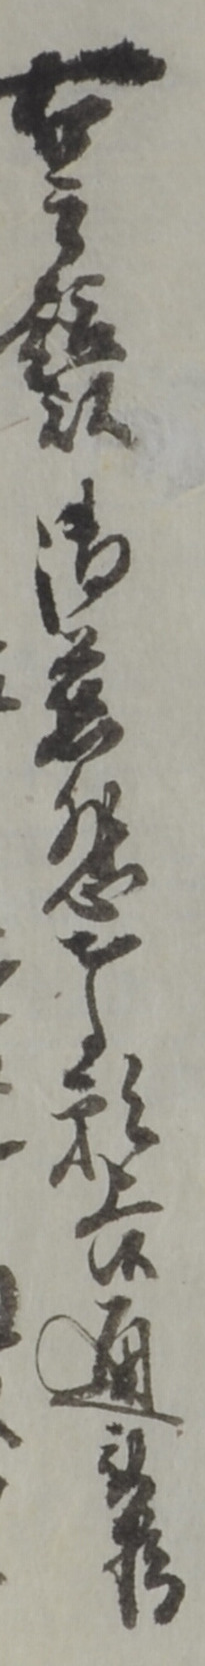右之趣以御慈悲奉願上候通被為仰付
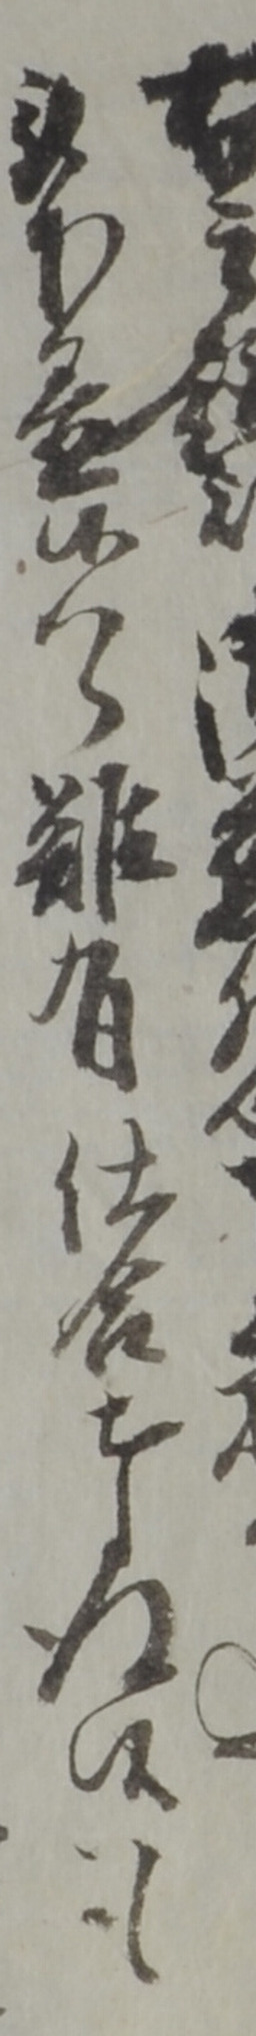被下置候ハヽ難有仕合奉存候以上
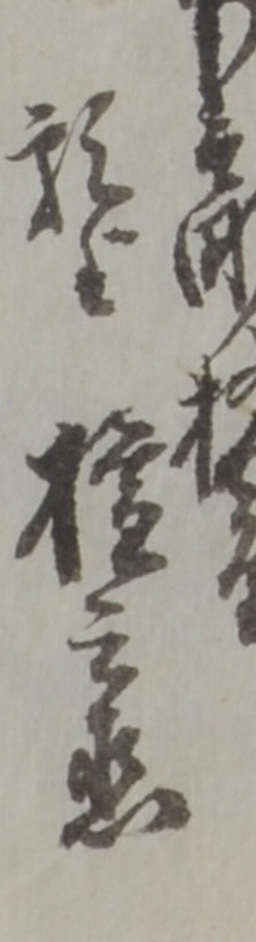願主宗兵衛

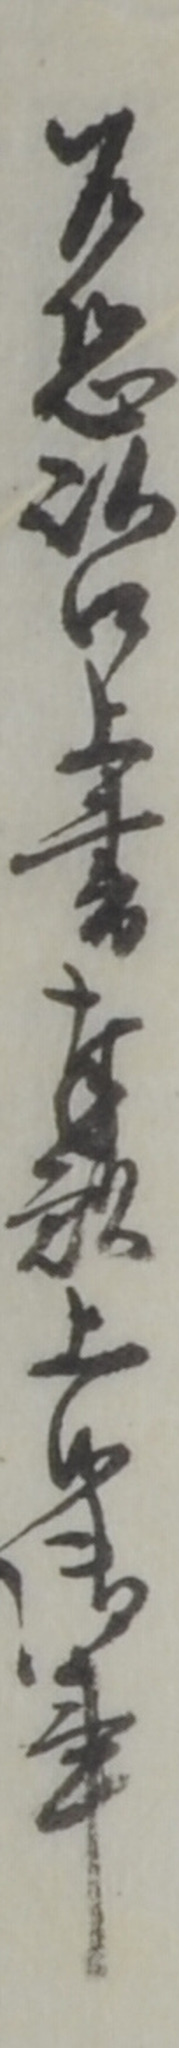乍恐以口上書奉願上候御事
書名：諸願書控簿
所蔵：伊那市立高遠町図書館・合同会社AMANE
